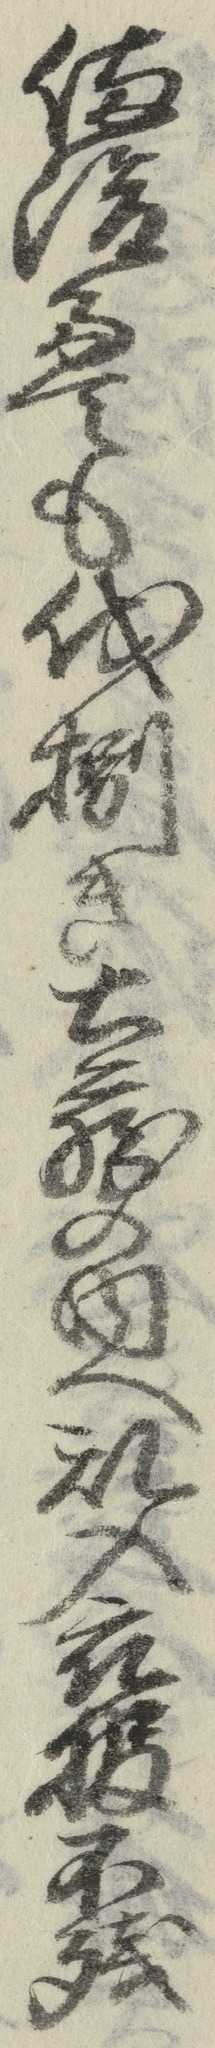備後畳も伐捌き土蔵の内へ乱入衣服不残
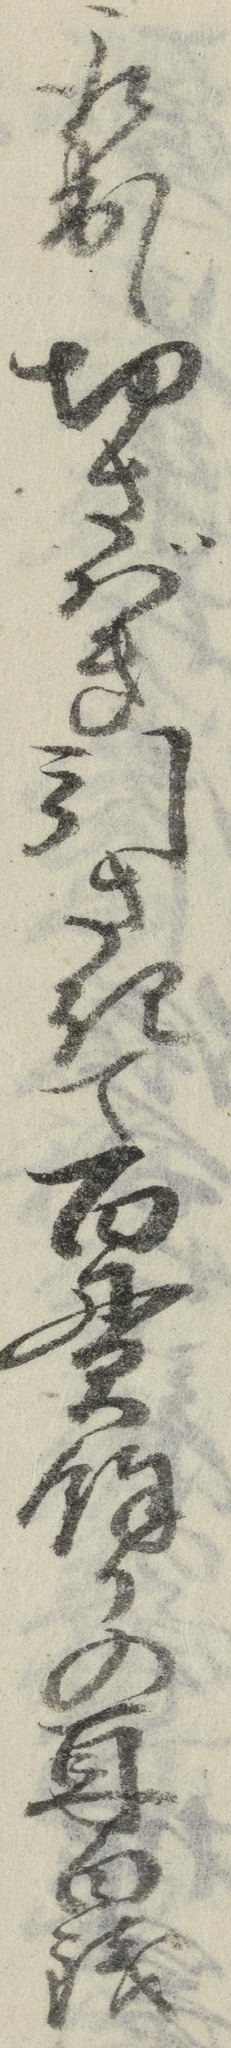取出し切さばき引さきて百貫余りの耳白銭
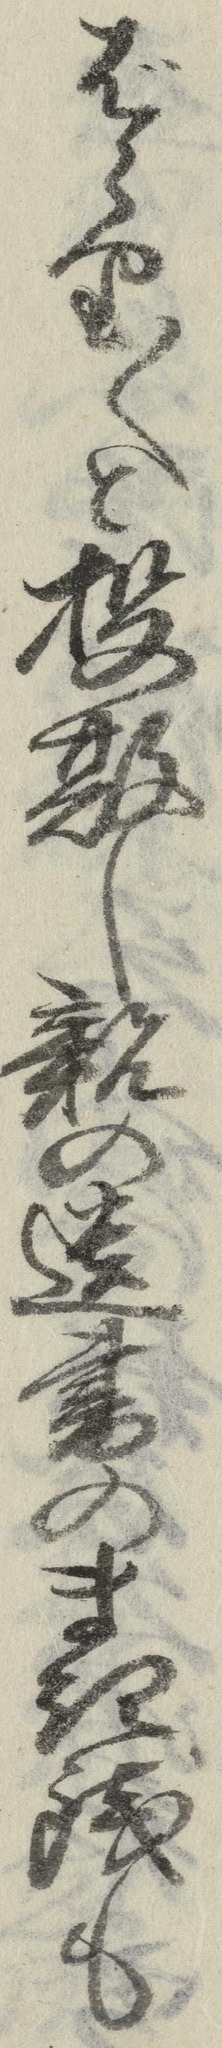ばらり〳〵と投散し親の遺書のまき銭も
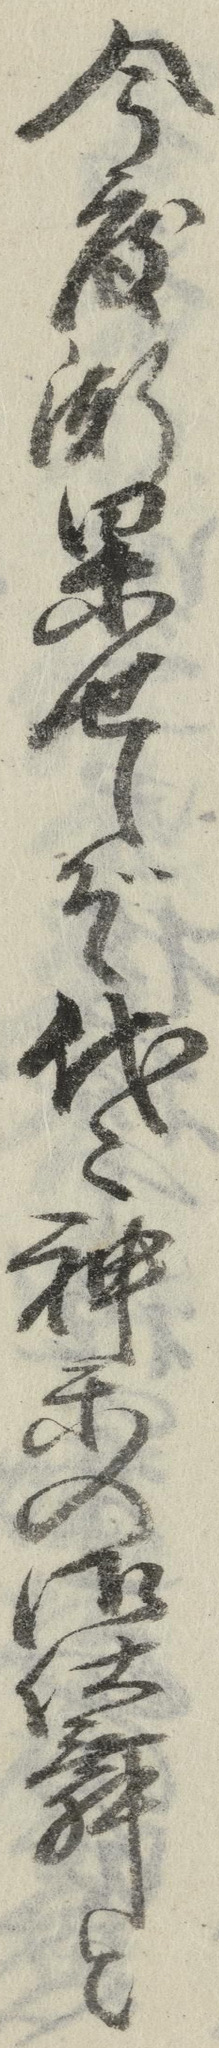今度漸果せしぞ代々神楽の御仕舞と
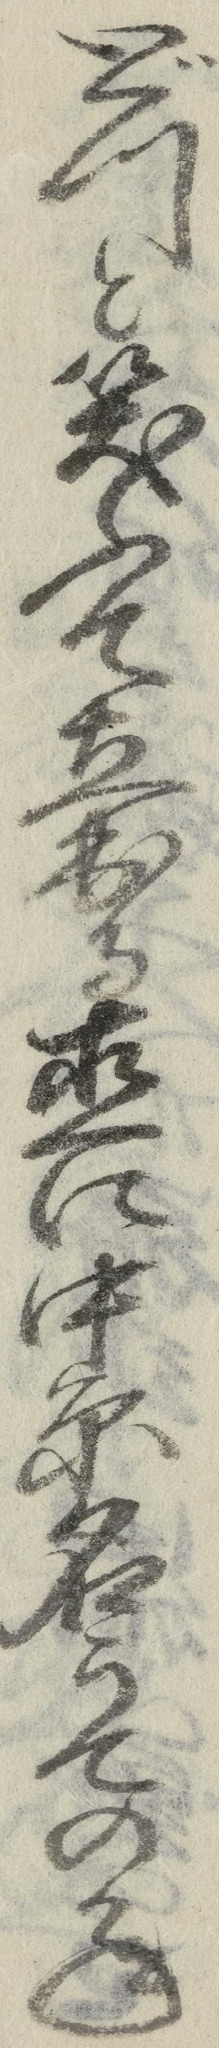どつと笑ふて立出る直に中原名うてのかね
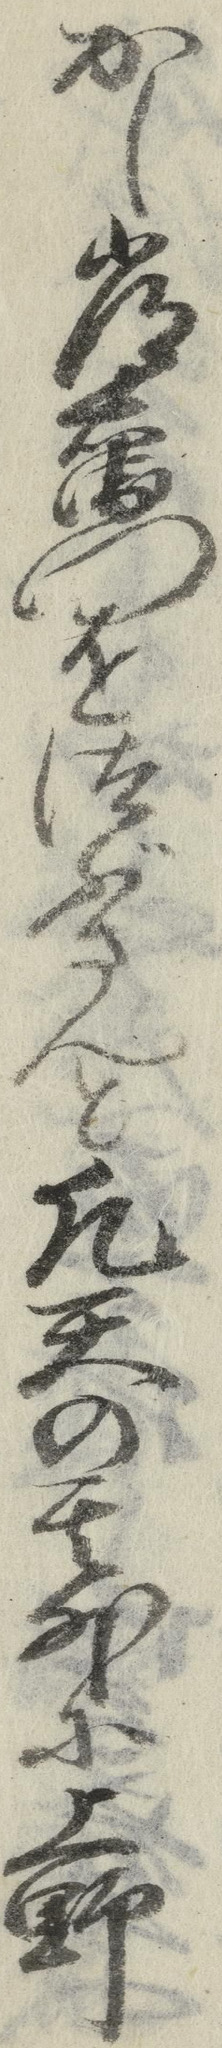かし常右衛門をつぶさんと凡天の其外に上野
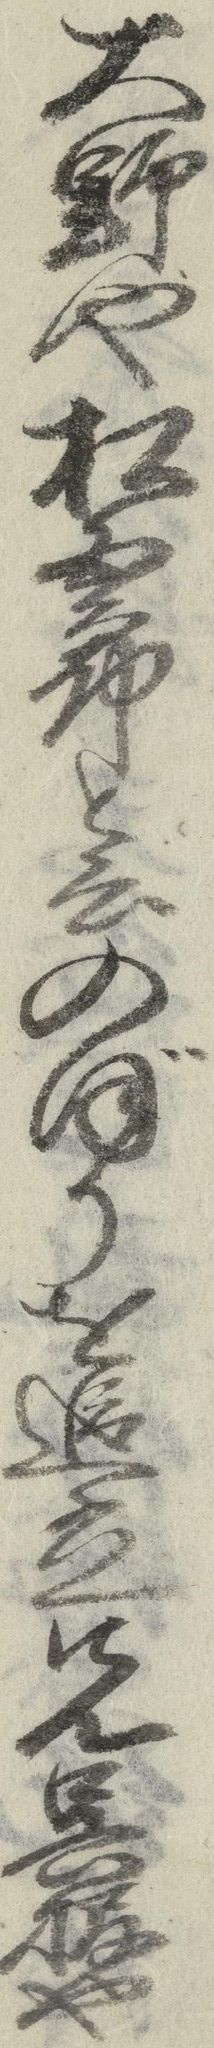大野や松五郎と云のぼりを追立先呉服や
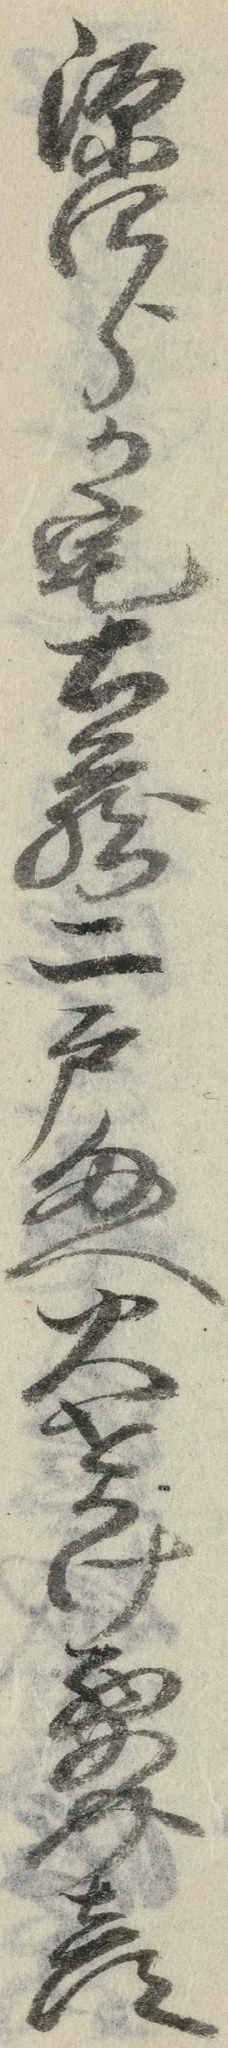源四郎か宅土蔵二戸まへ火をかけ要介彦
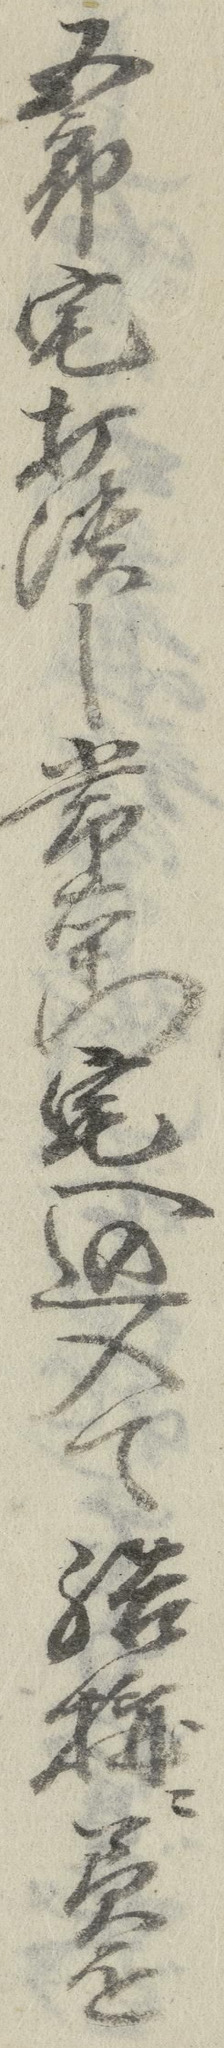五郎宅打潰し常右衛門宅へ込入て結構に美を
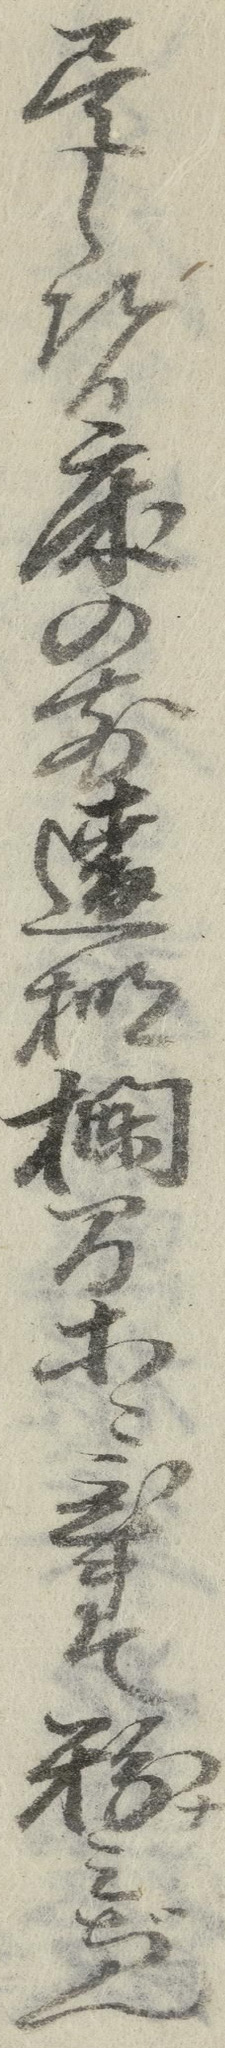尽したる床の前違棚欄間等ニ至まて粉
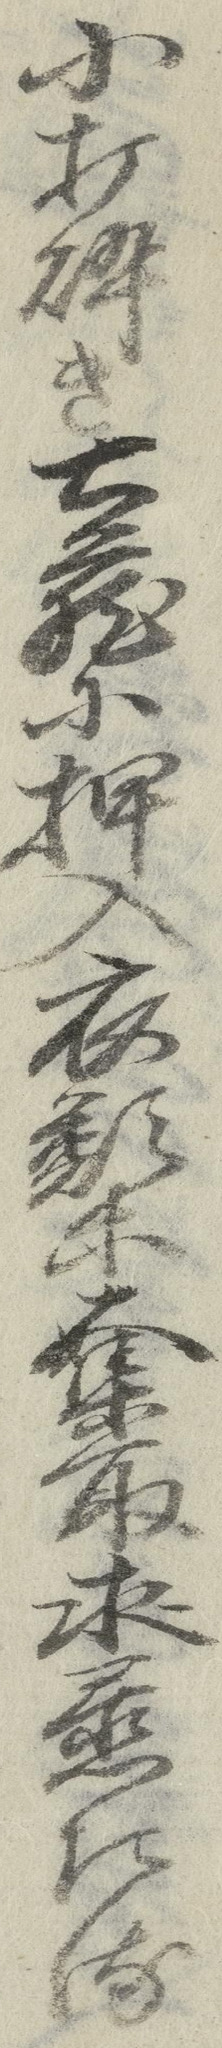に打砕き土蔵に押入衣類等奪取求置たる
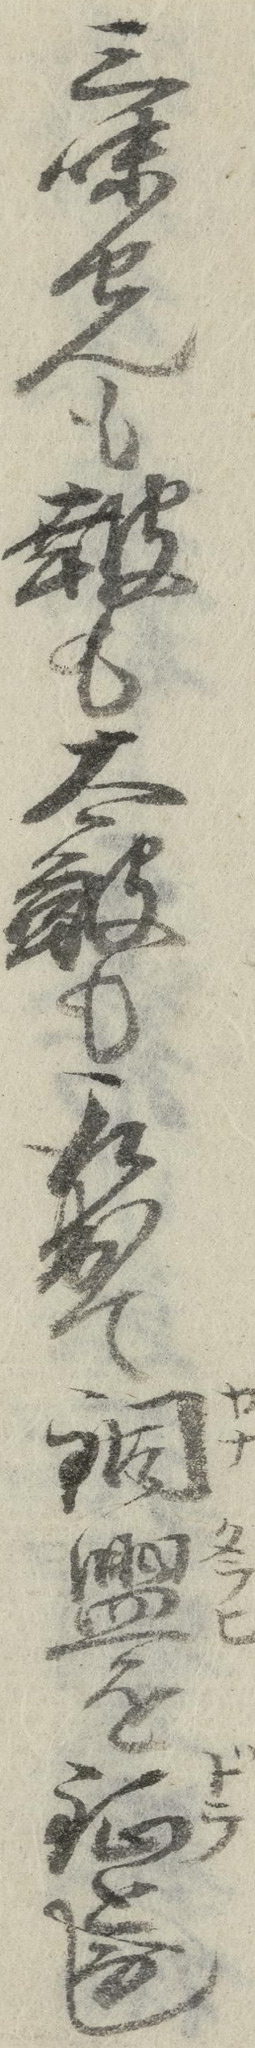三味せんも鞁も太鼓も取出て銅盥を鉦となし
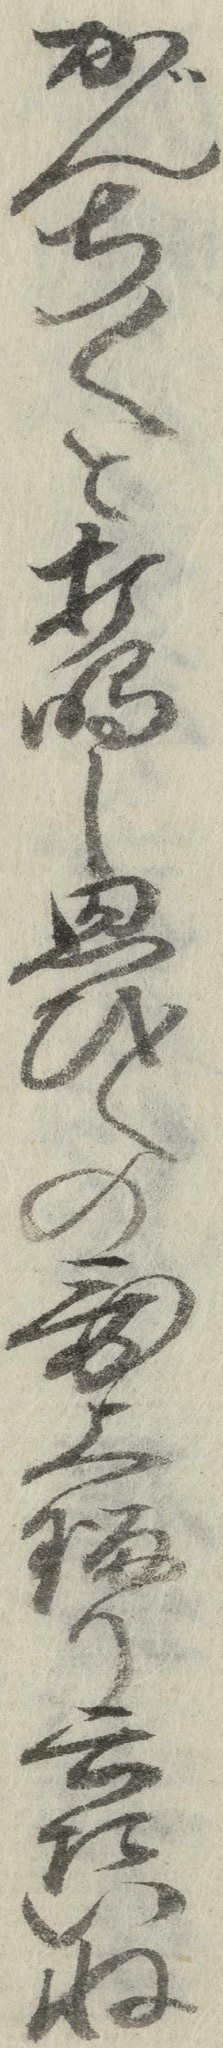がんち〳〵と打鳴し思ひ〳〵の寄上瑠り云たいね
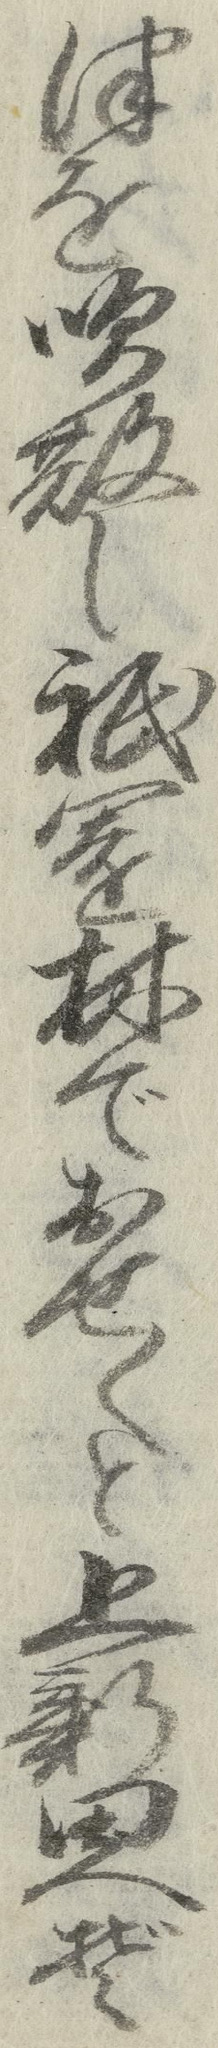つを吹散し祇園林でおせ〳〵と上新田へぞ
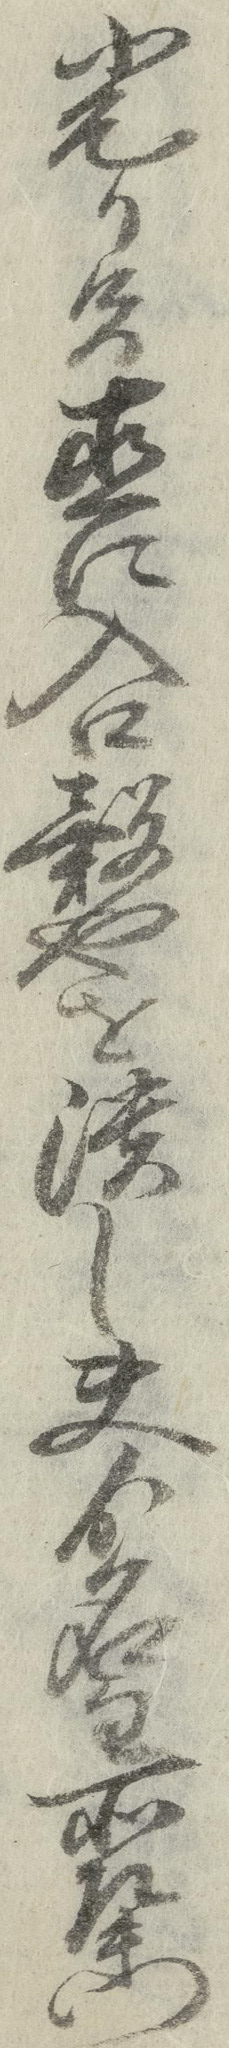登りける直に入口穀やを潰し夫ゟ名主所左衛門
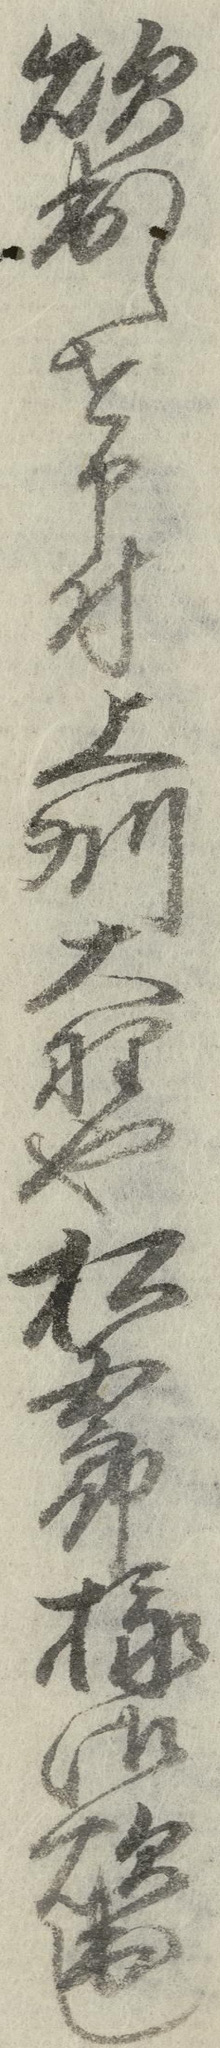炊出しを申付上州大野や松五郎様御炊出し
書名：浅間大焼騒動記　中
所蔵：東京大学地震研究所図書室 Earthquake Research Institute Library, The University of Tokyo, JAPAN
